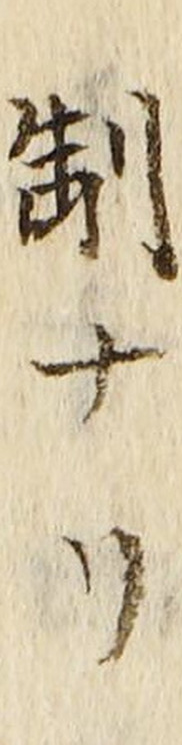制ナリ
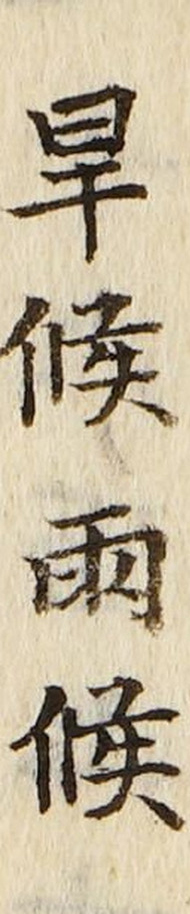旱候雨候
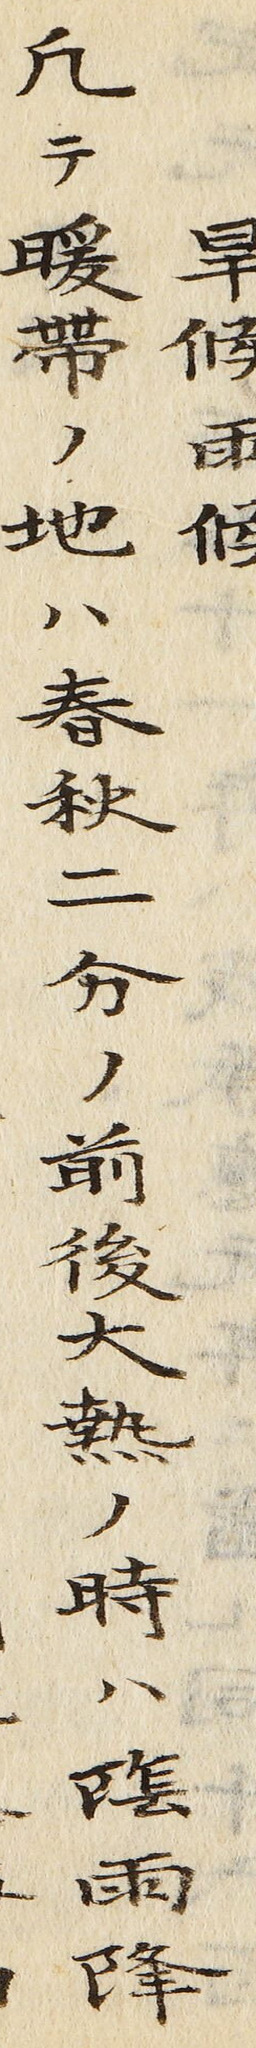凡テ暖帯ノ地ハ春秋ニ分ノ前後大熱ノ時ハ陰雨降
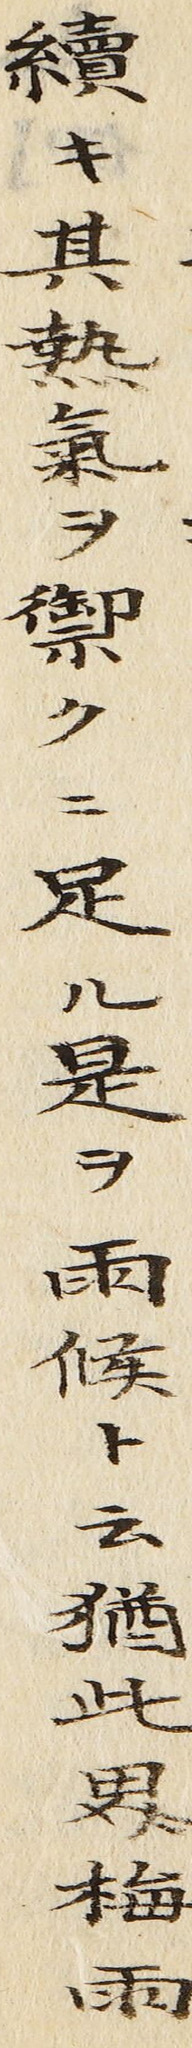続キ其熱気ヲ禦クニ足ル是ヲ雨候ト云猶此界梅雨
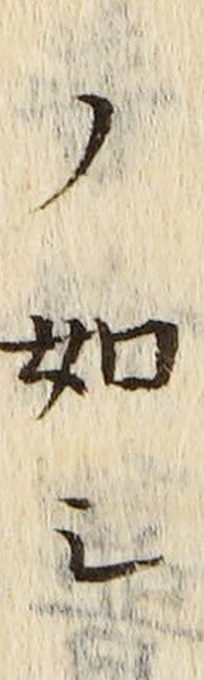ノ如シ
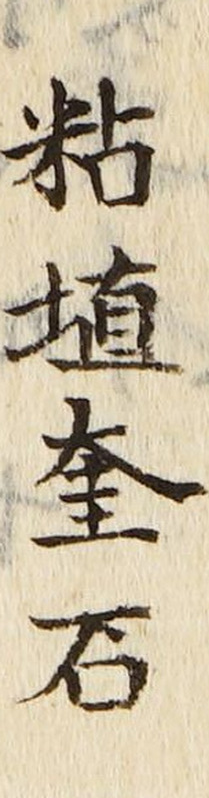粘埴奎石
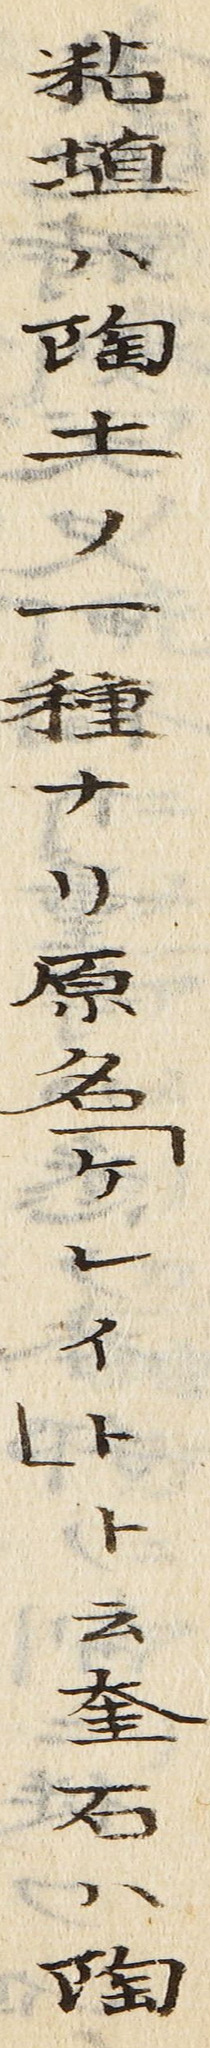粘埴ハ陶土ノ一種ナリ原名「ケレイト」ト云奎石ハ陶
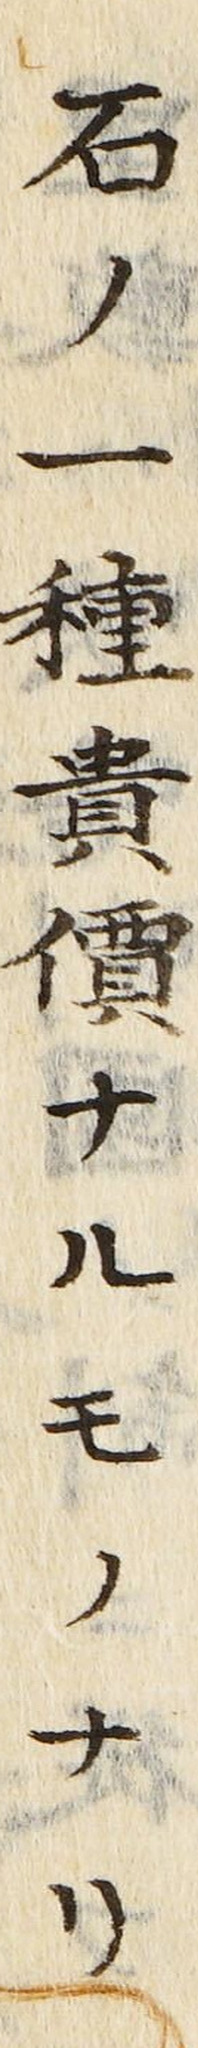石ノ一種貴価ナルモノナリ
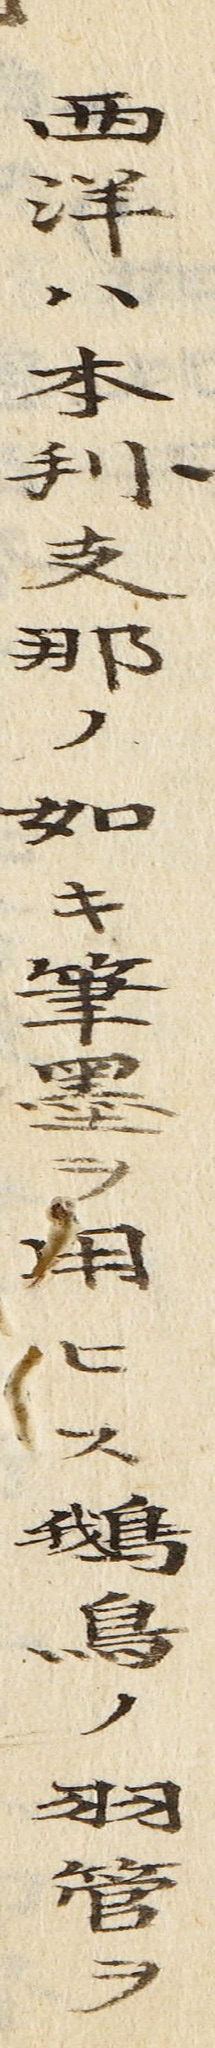西洋ハ本邦支那ノ如キ筆墨ヲ用ヒス鵝鳥ノ羽管ヲ
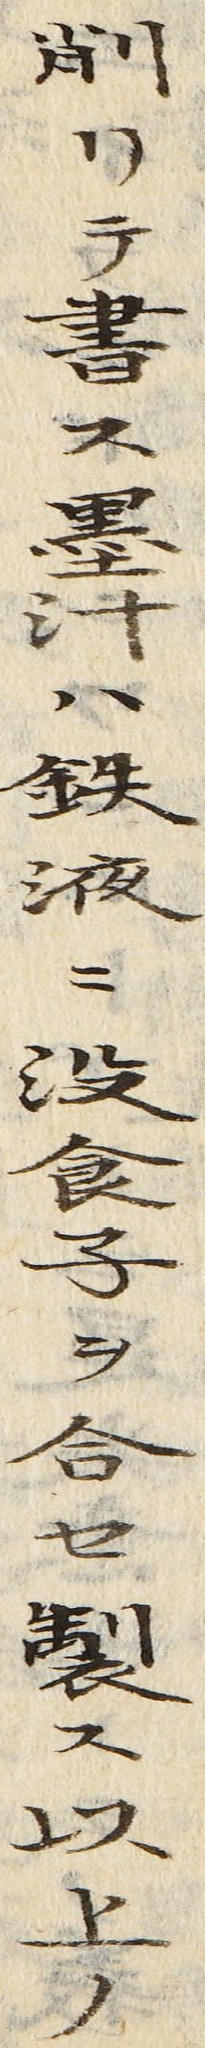削リテ書ス墨汁ハ鉄液ニ没食子ヲ合セ製ス以上ノ
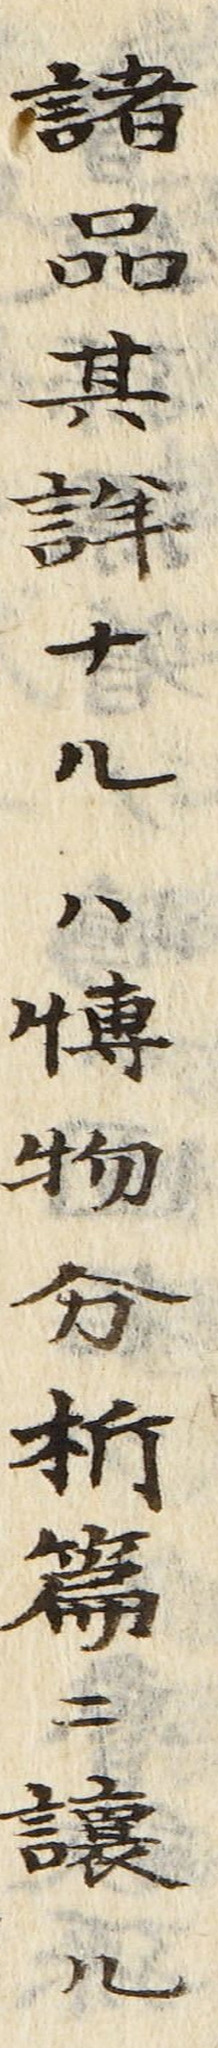諸品其詳ナルハ博物分析篇ニ譲ル
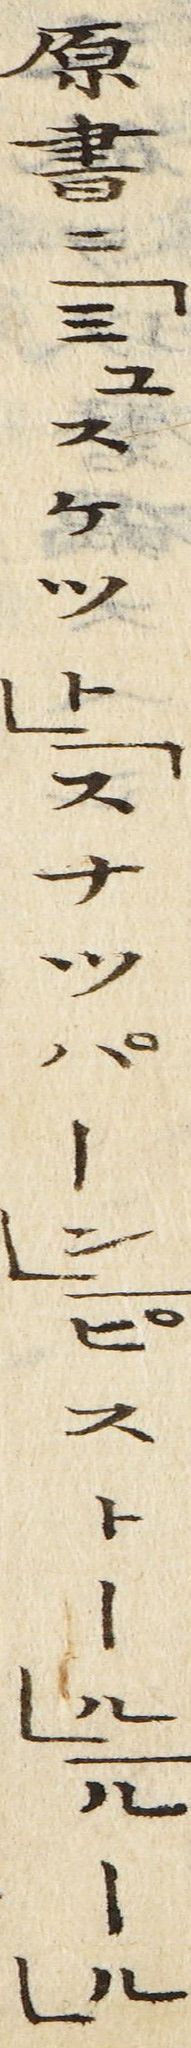原書ニ「ミュスケツト」「スナツパーン」「ピストール」「ルール」
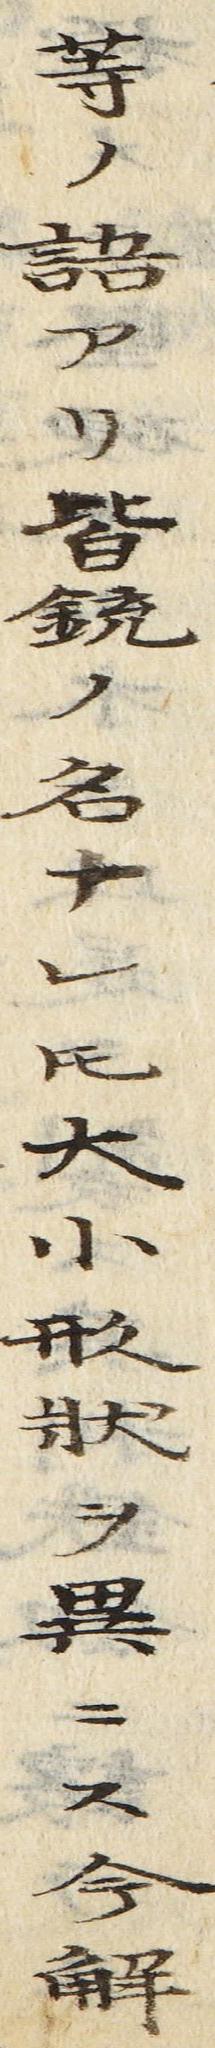等ノ語アリ皆銃ノ名ナレトモ大小形状ヲ異ニス今解
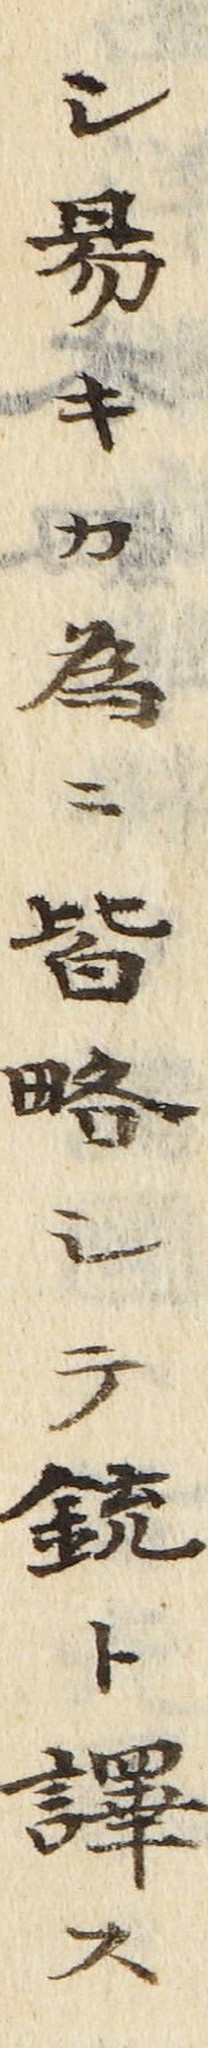シ易キカ為ニ皆略シテ銃ト訳ス

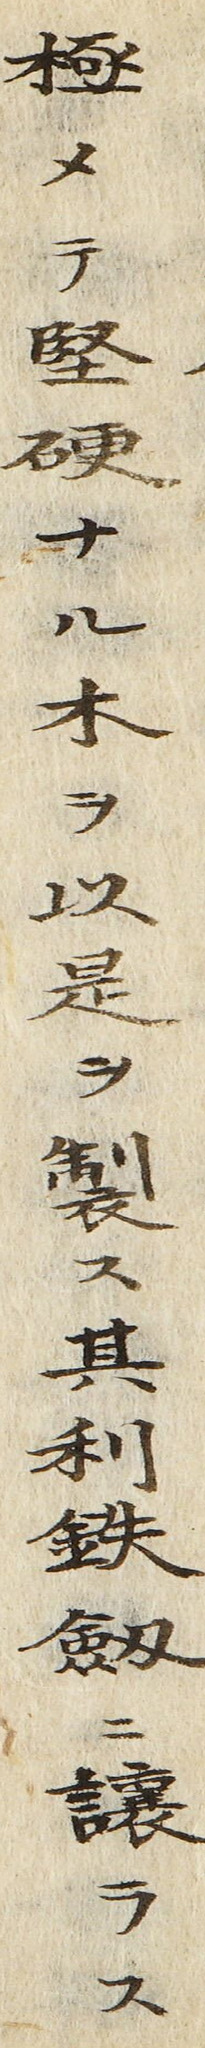極メテ堅硬ナル木ヲ以是ヲ製ス其利鉄剣ニ譲ラス
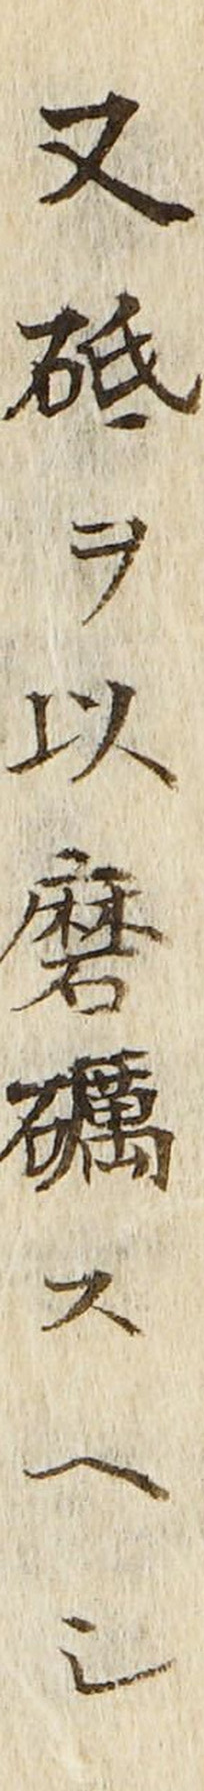又砥ヲ以磨礪スヘシ
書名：漂流紀事
